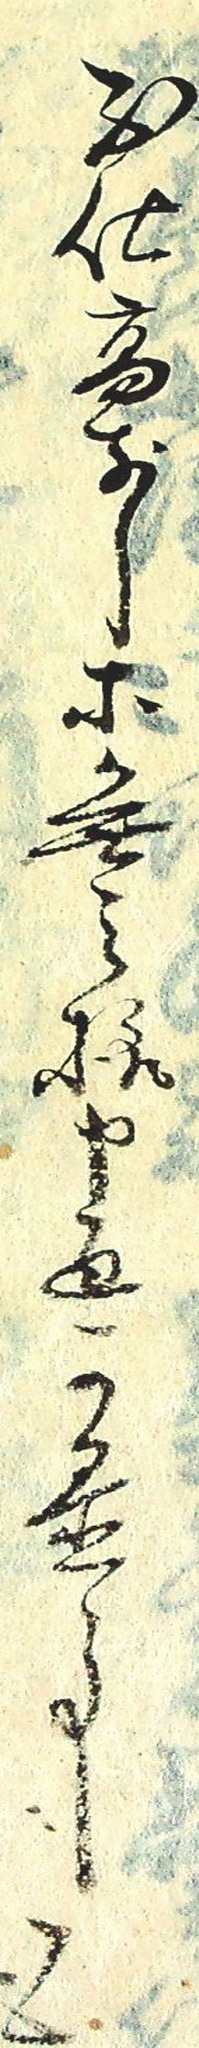不仕高声等無之様申通可置事以上
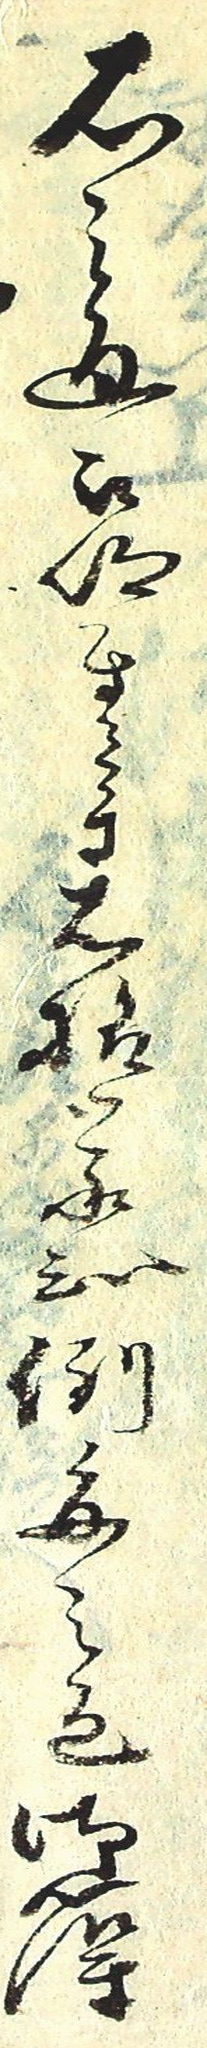右之通被仰付候に付右様御承知例毎之通御心得
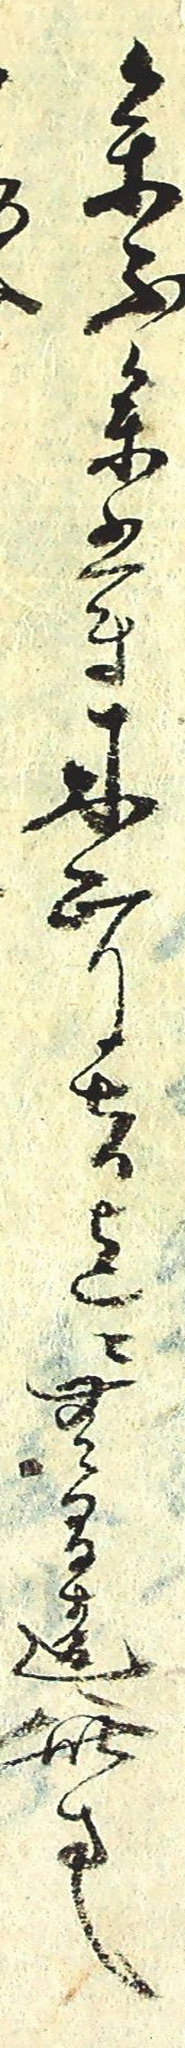参不参書付来正月七日迄に無間違此方へ
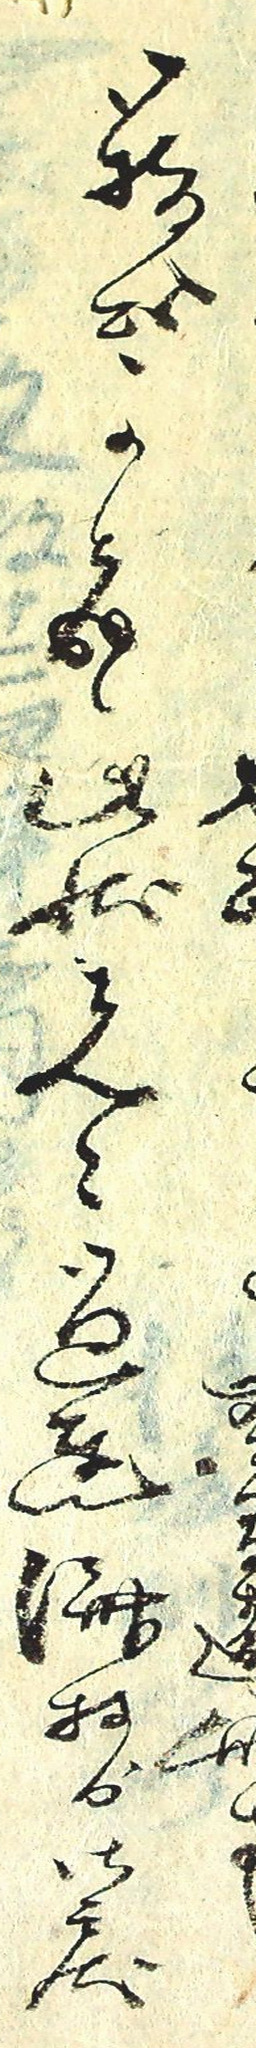御指出可被成候此状先々御廻達済村ゟ御戻
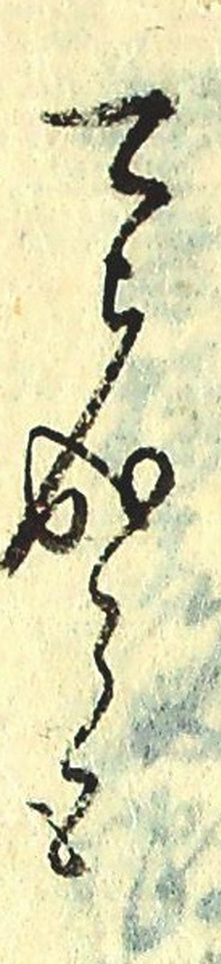可被成候以上
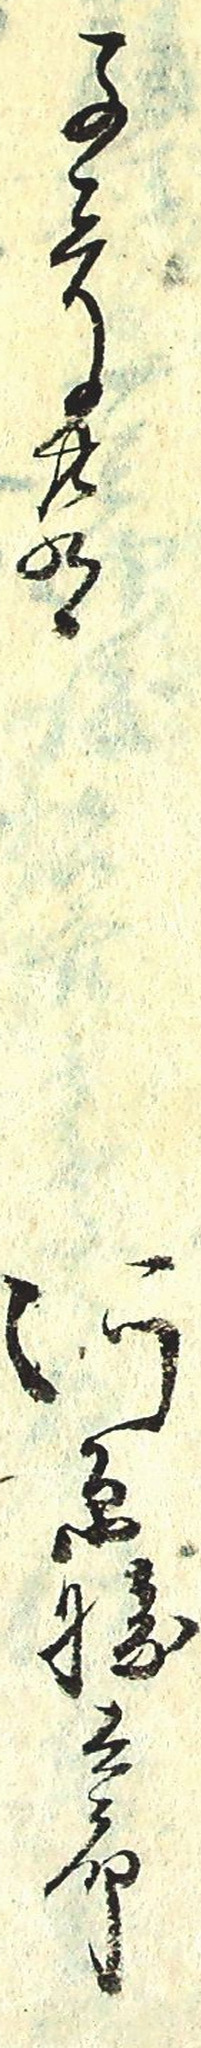子十二月廿九日河原勝太郎
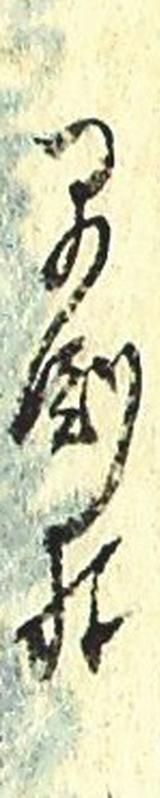早渕村
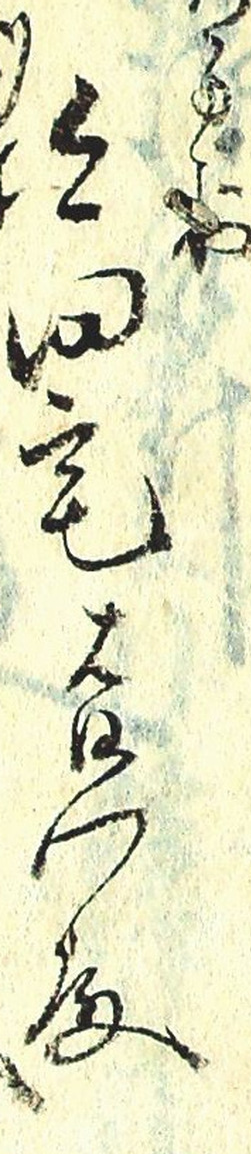今田宅右衛門殿
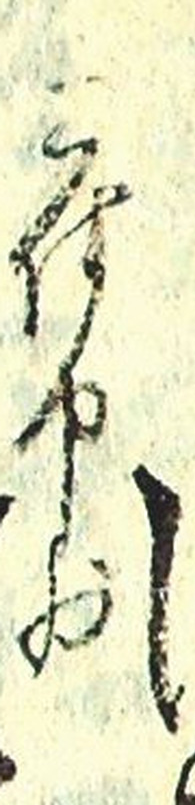府中村
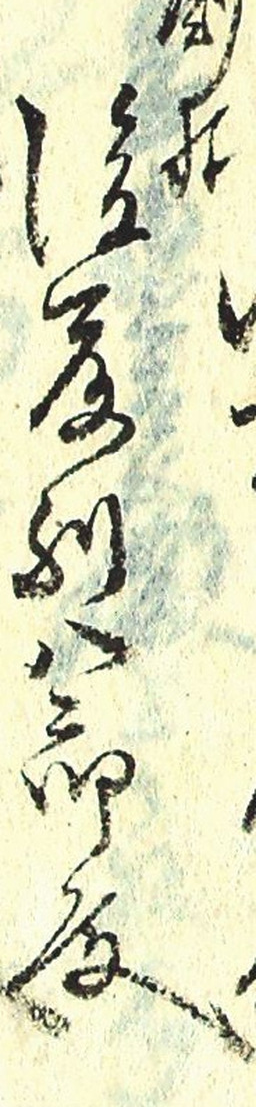後藤利八郎殿
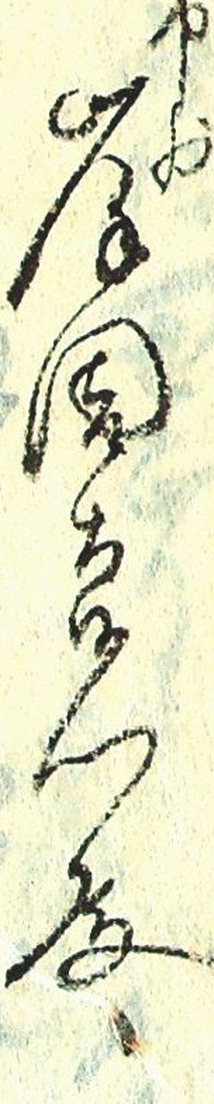岸周右衛門殿

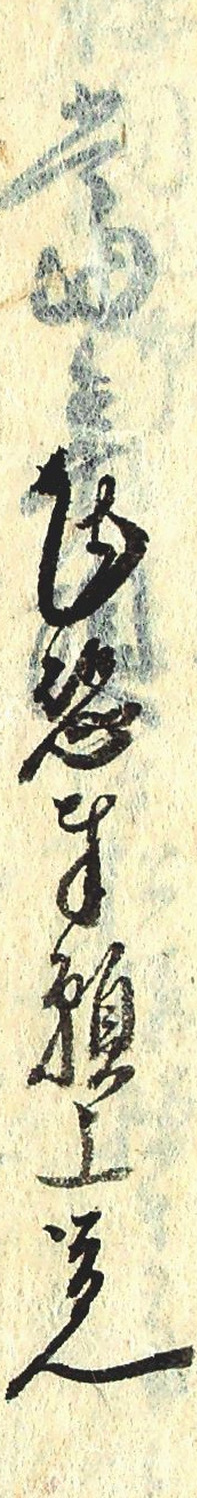乍恐奉願上覚
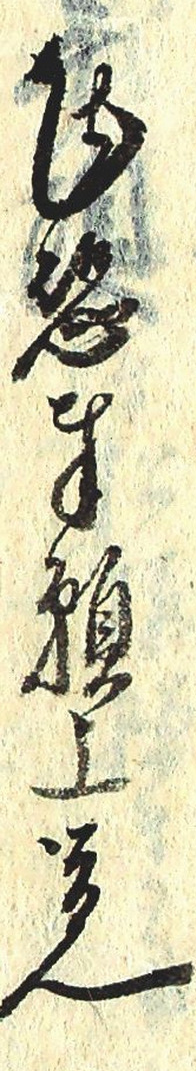乍恐奉願上覚
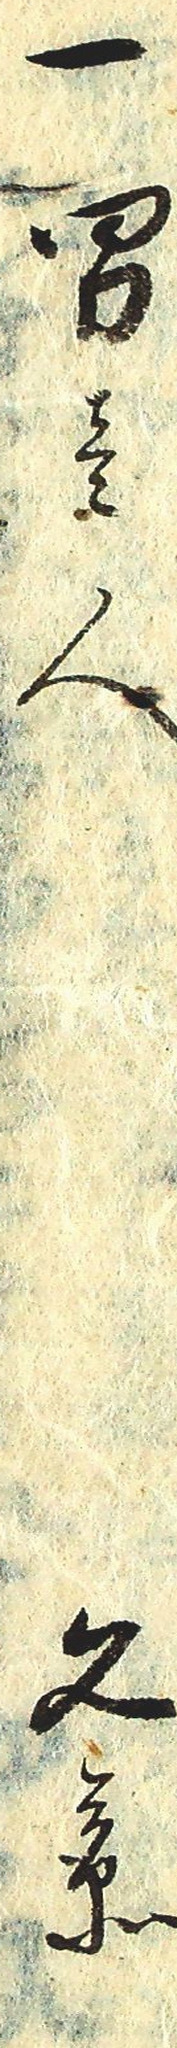一男壱人久兵衛
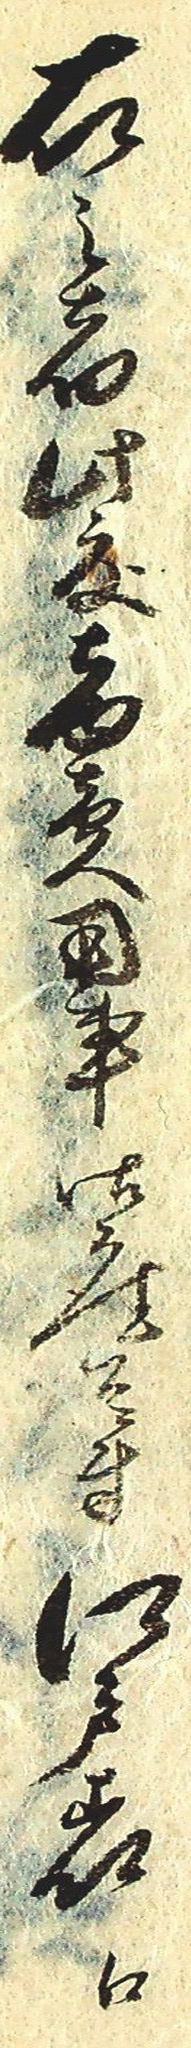右之者此度商売用事御座候に付江戸表え
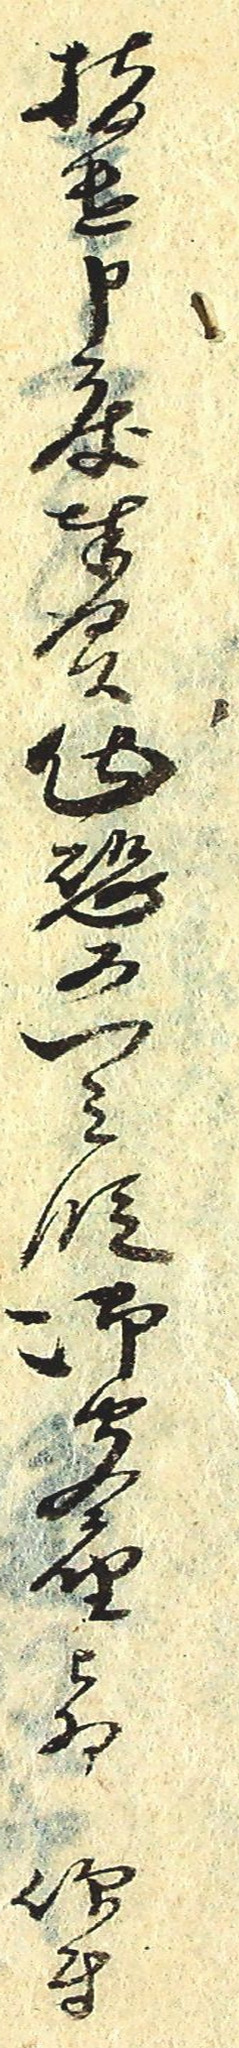指遣申度奉存候乍恐右之段御聞届被為仰付
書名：諸御願書控(弐番）
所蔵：鳴門教育大学 Naruto University of Education
